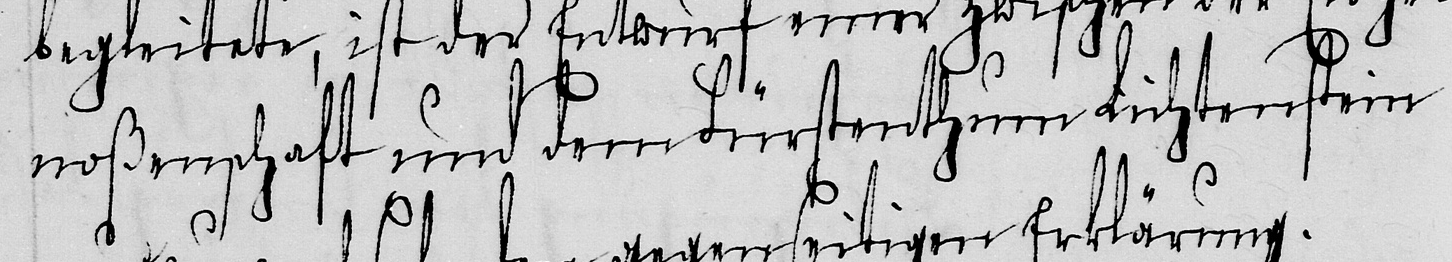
noßenschaft und dem Fürstenthum Lichtenstein
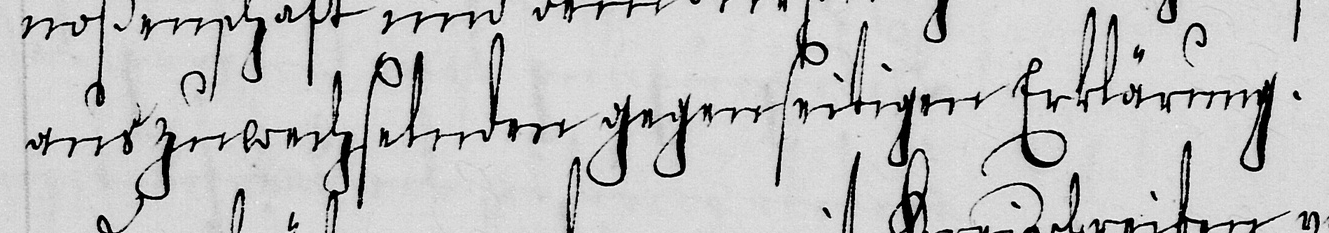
auszuwechselnden gegenseitigen Erklärung.
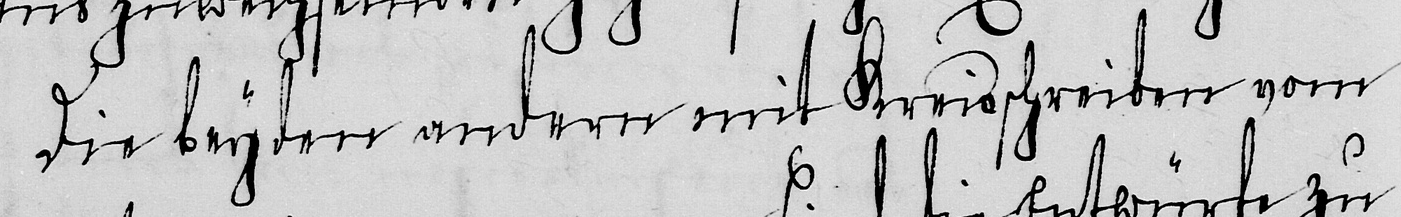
Die beyden andern mit Kreisschreiben vom
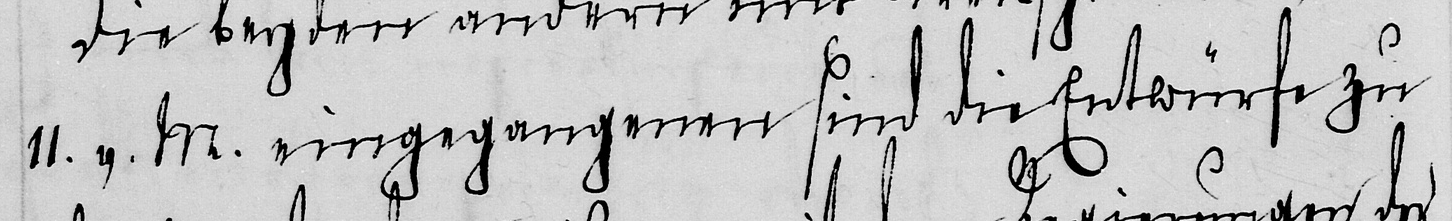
11. v. M. eingegangenen sind die Entwürfe zu
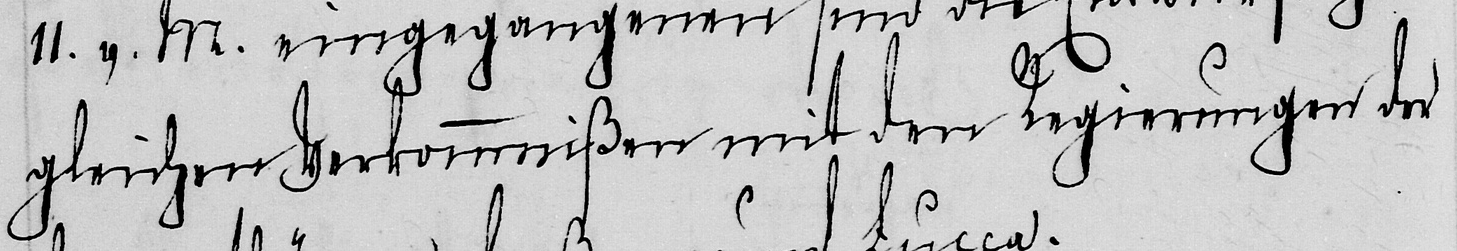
gleichen Verkommnißen mit den Regierungen der
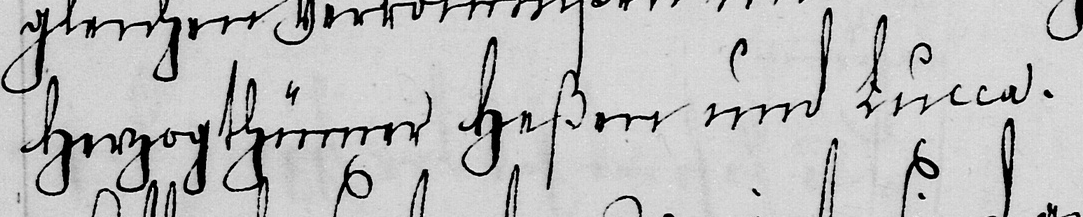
Herzogthümer Heßen und Lucca.
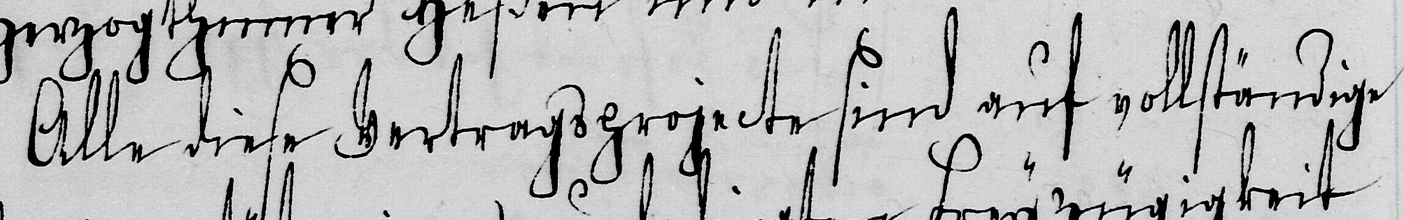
Alle diese Vertragsprojecte sind auf vollständige
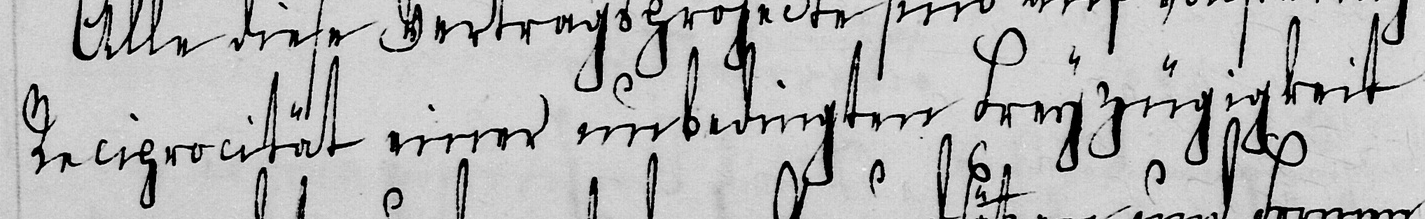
Reciprocität einer unbedingten Freyzügigkeit
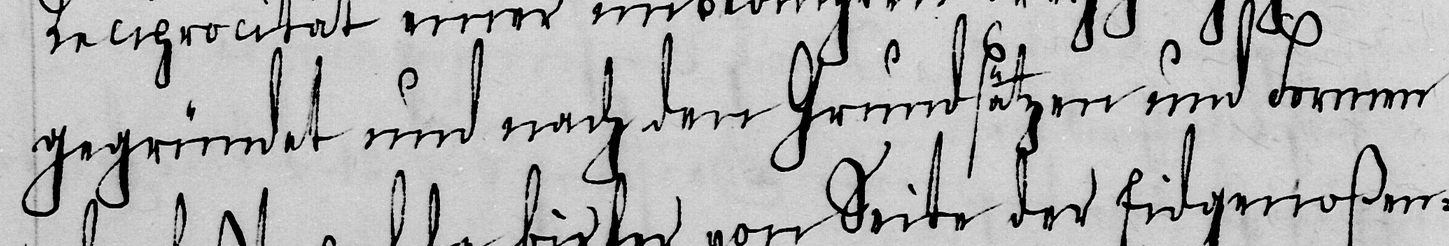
gegründet und nach den Grundsätzen und Formen
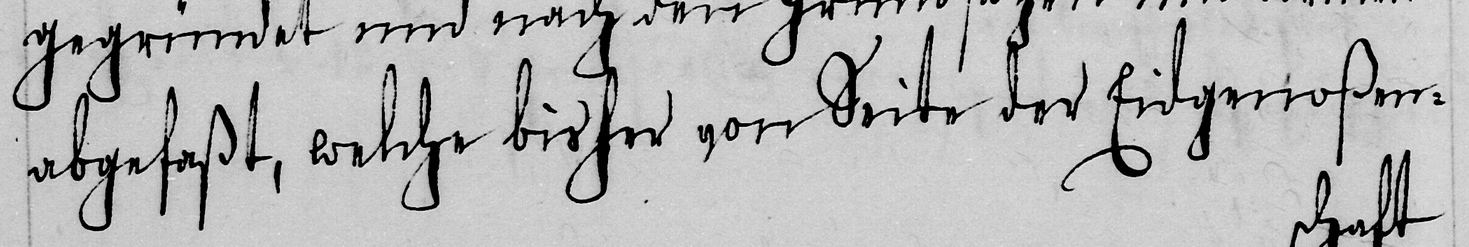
abgefaßt, welche bisher von Seite der Eidgenoßen-
